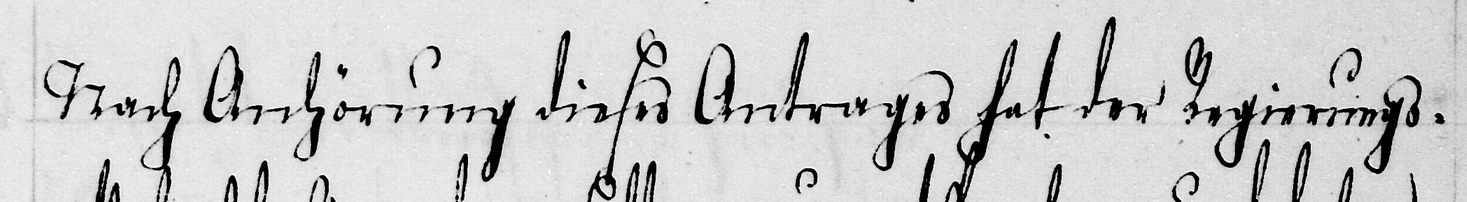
Nach Anhörung dieses Antrages hat der Regierungs¬
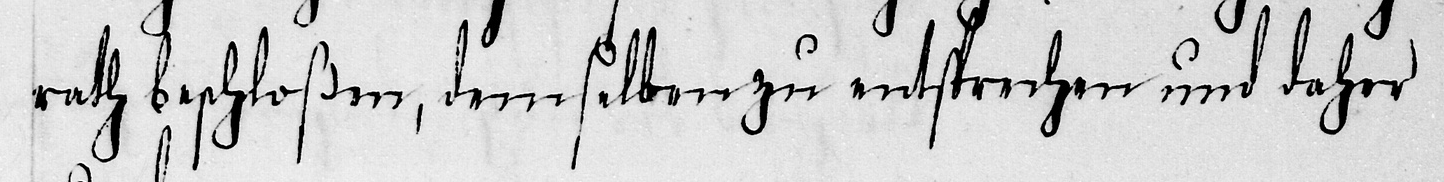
rath beschloßen, demselben zu entsprechen und daher
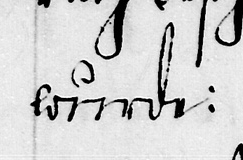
wurde:
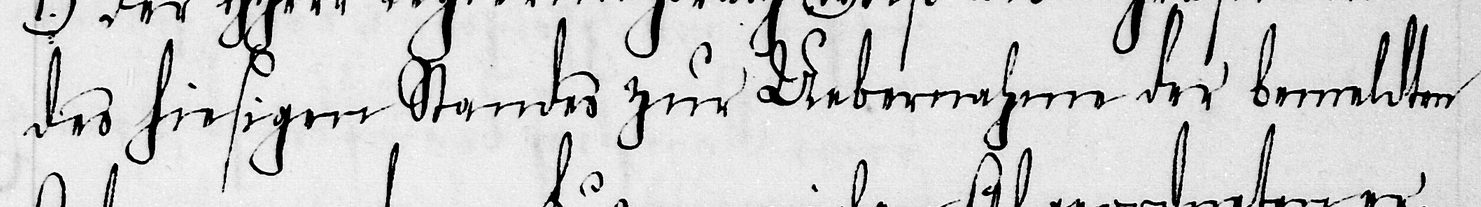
des hiesigen Standes zur Uebernahme der bemeldten
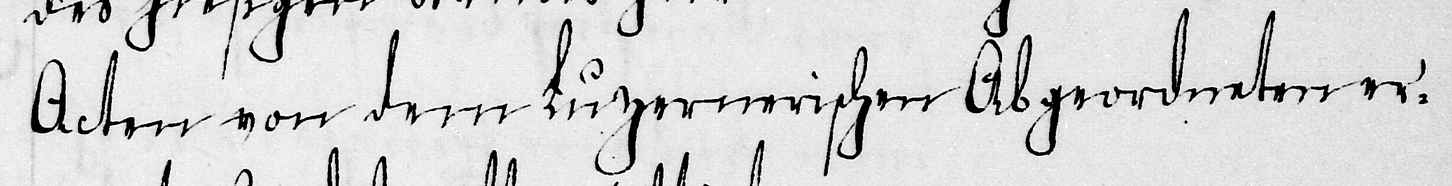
Acten von dem Luzernerischen Abgeordneten er¬
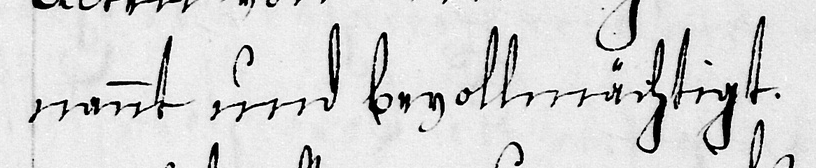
nannt und bevollmächtigt.
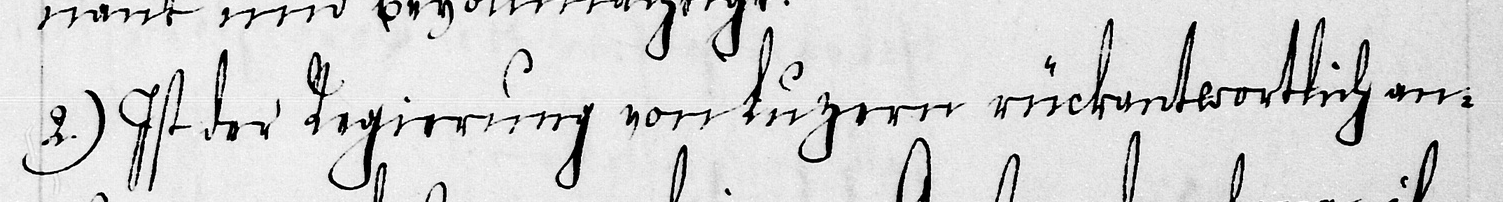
2.) Ist der Regierung von Luzern rückantwortlich an¬
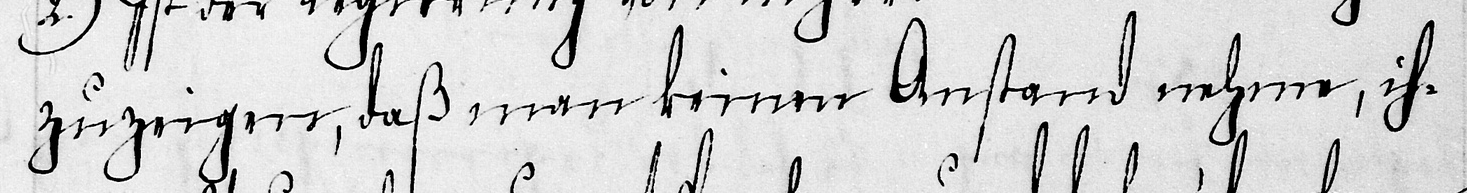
zuzeigen, daß man keinen Anstand nehme, ih¬
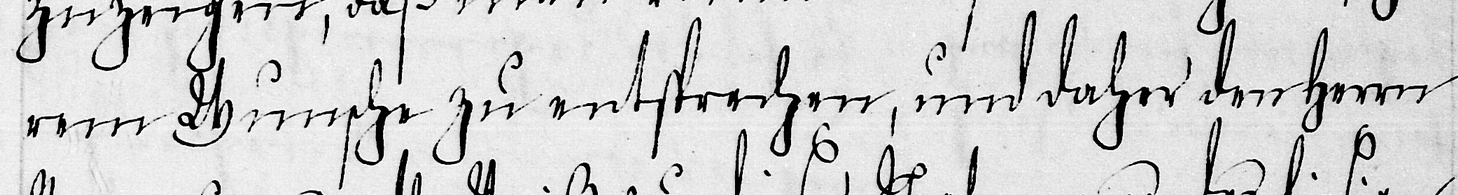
ren Wunsche zu entsprechen, und daher den Herrn
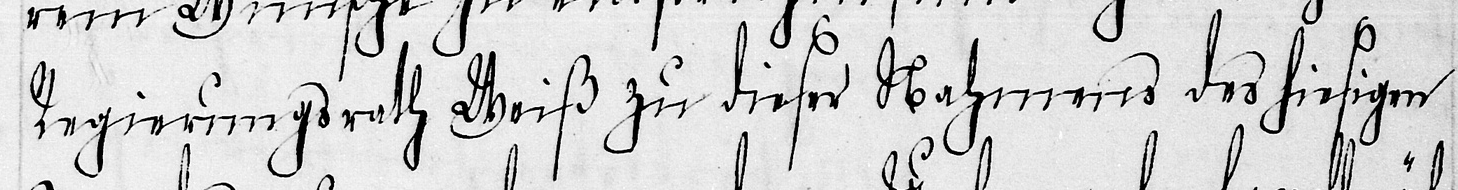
Regierungsrath Weiß zu dieser Nahmens des hiesigen
